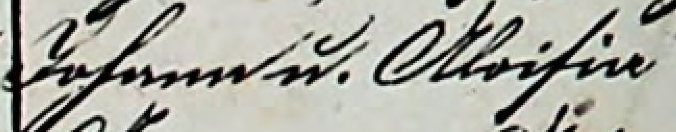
Johann u. Aloisia
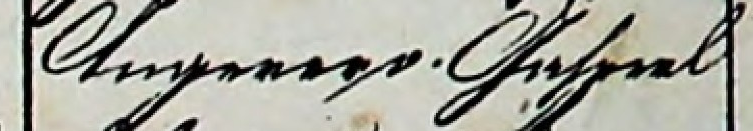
Angerer v. Gasperl
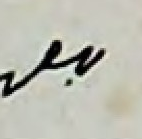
do
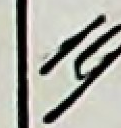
19
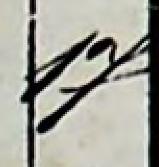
17
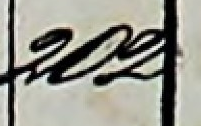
202
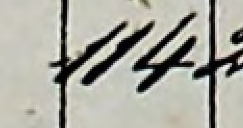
114
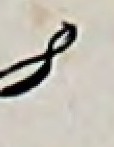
8
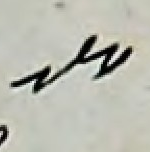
do
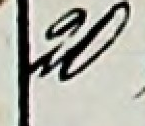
20
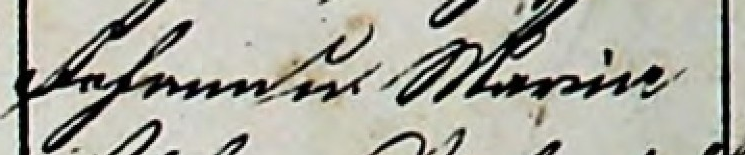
Johann u. Maria
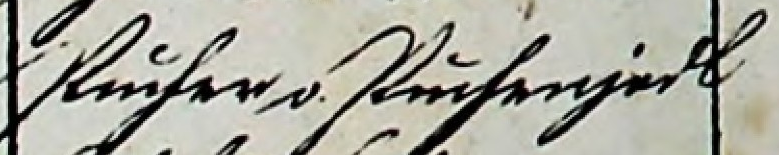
Pucher v. Puchenjodl
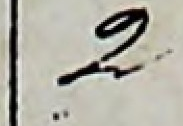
2
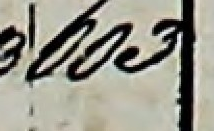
603
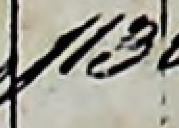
113
